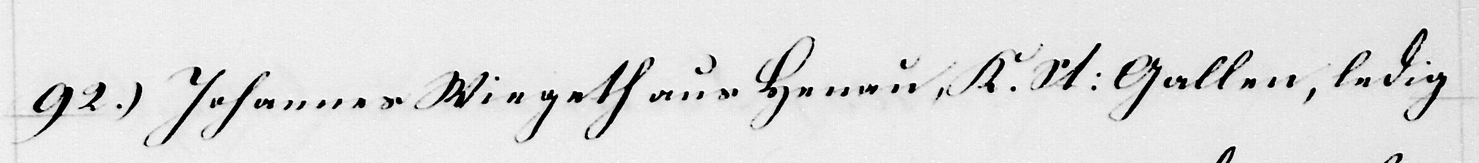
92.) Johannes Wiegeth aus Henau, K. St: Gallen, ledig
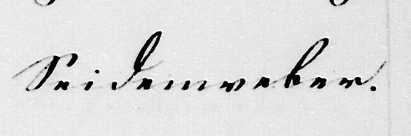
Seidenweber.
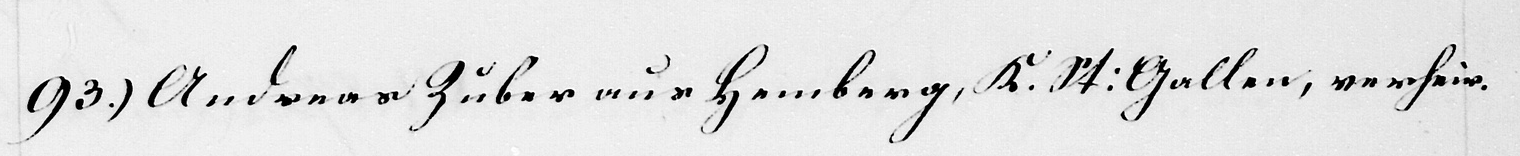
93.) Andreas Zuber aus Hemberg, K. St: Gallen, verheir.
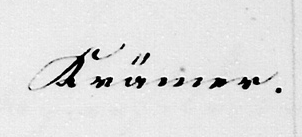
Krämer.
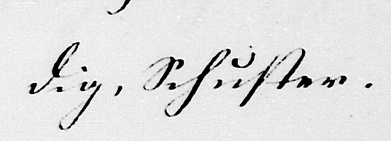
dig, Schuster.
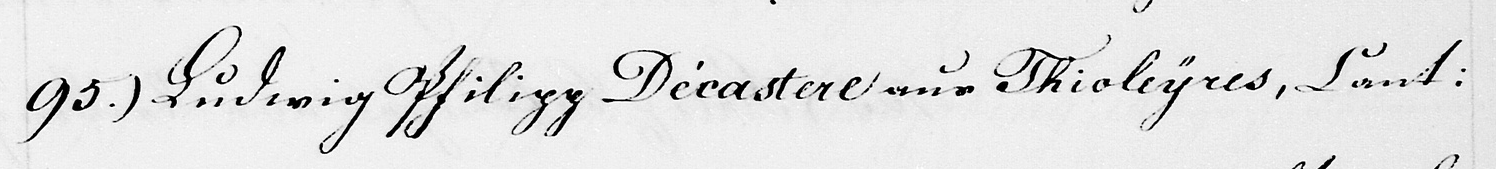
95.) Ludwig Philipp Décastere aus Thioleyres, Cant:
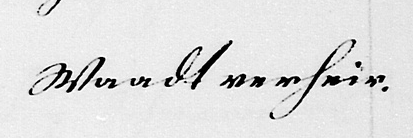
Waadt verheir.
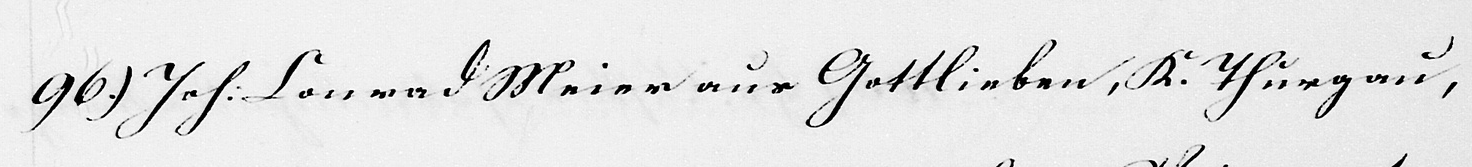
96.) Joh: Conrad Meier aus Gottlieben, K. Thurgau,
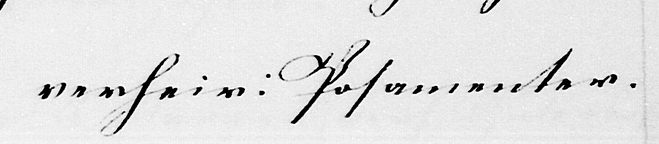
verheir: Posamenter.
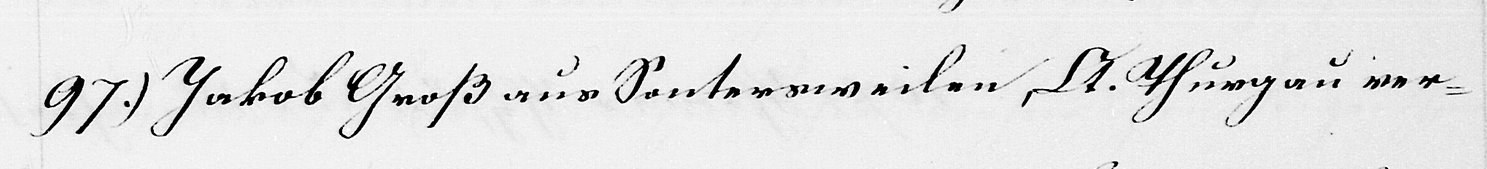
97.) Jakob Groß aus Sontersweilen, Ct. Thurgau ver¬
